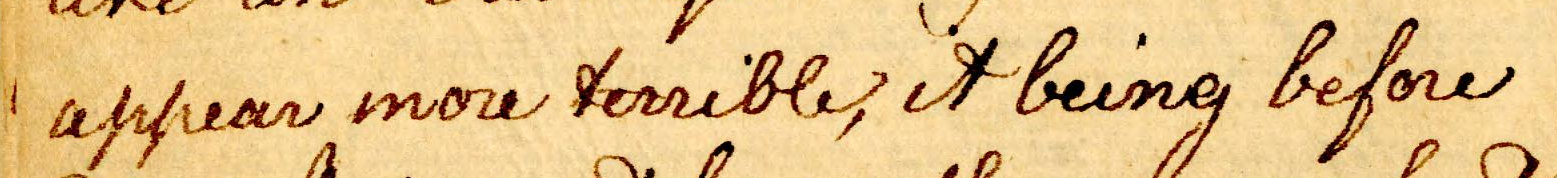appear more terrible, it being before
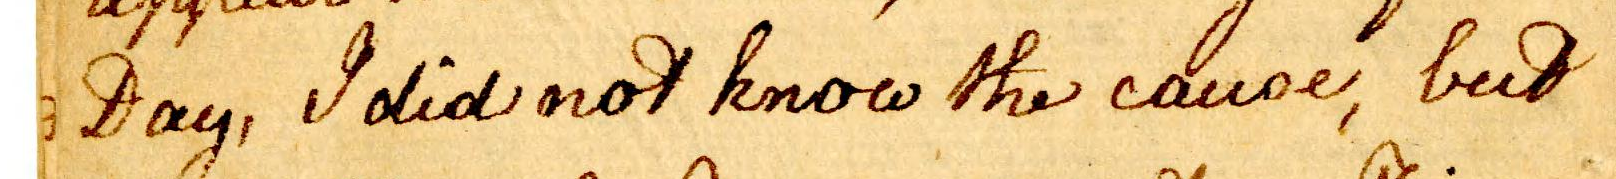Day, I did not know the cause, but
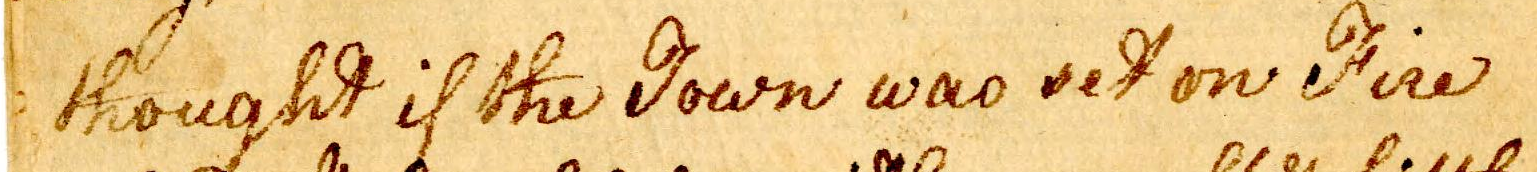thought if the Town was set on Fire
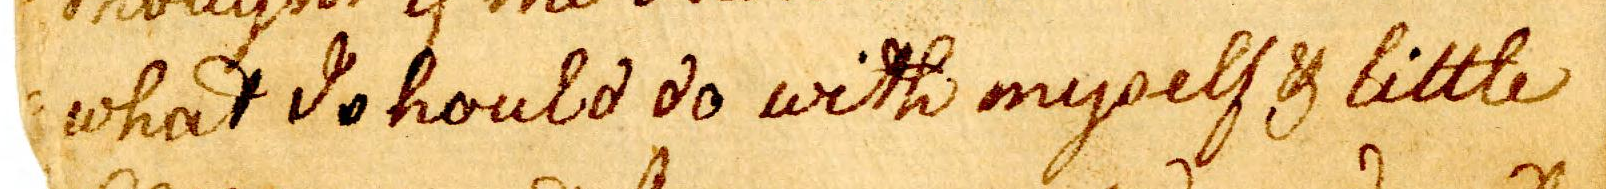what I should do with myself & little
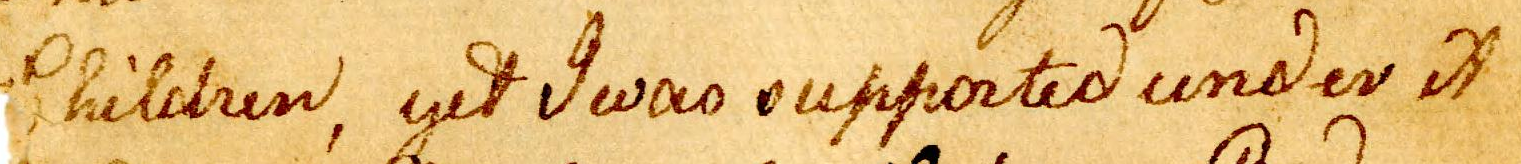Children, yet I was supported under it
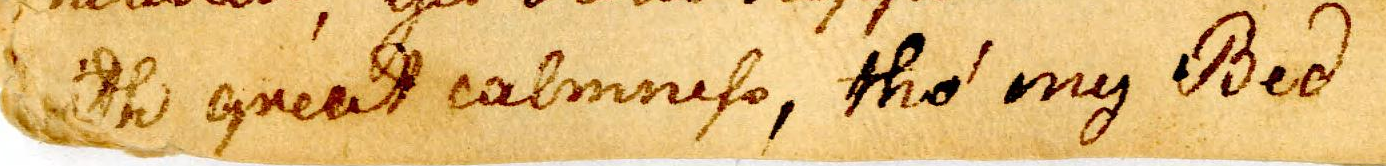th great calmness, tho' my Bed
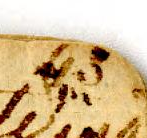43
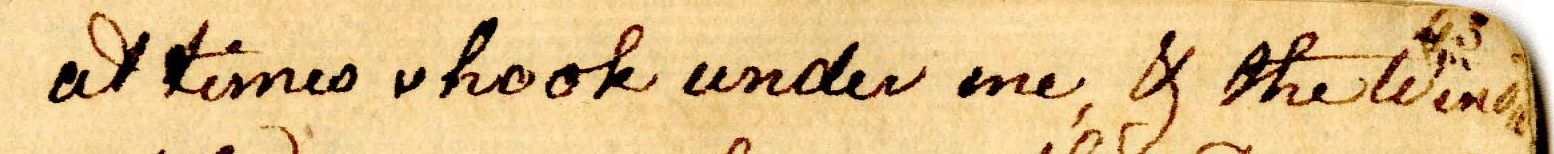at times shook under me, & the Wind
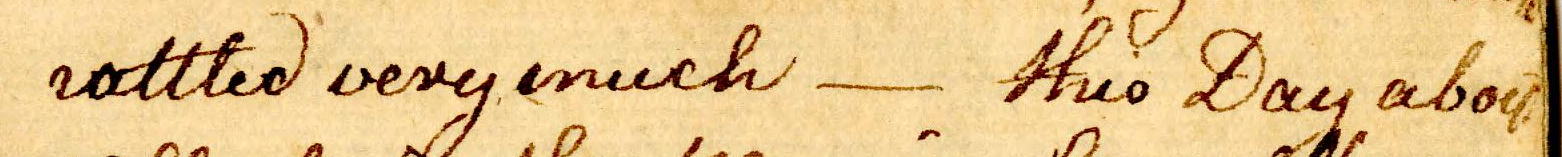rattled very much- this Day abou
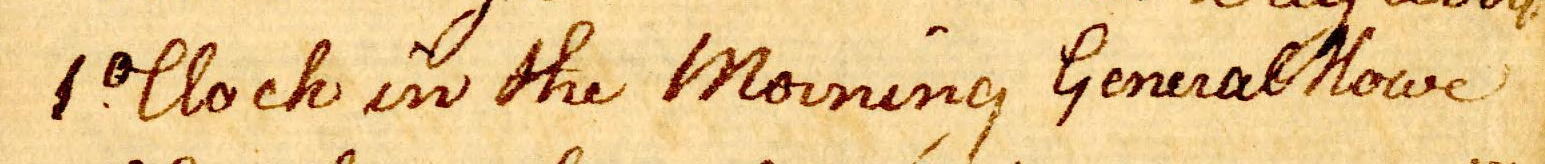1 ^o Clock in the Morning General Howe
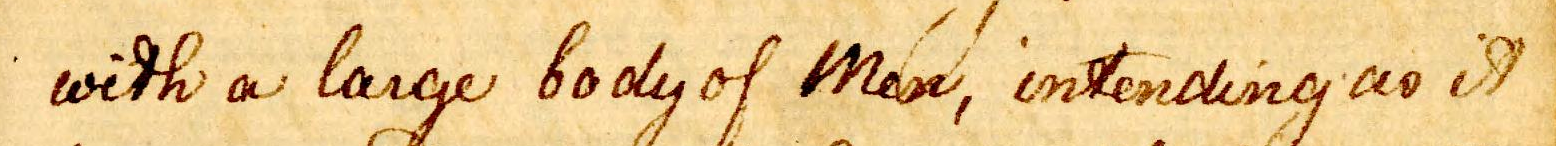with a large body of Men, intending as it
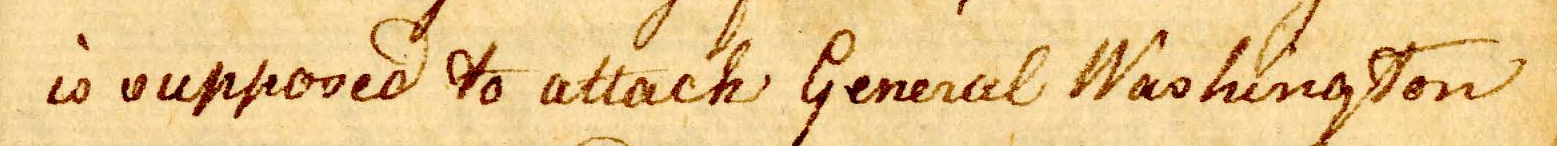is supposed to attack General Washington
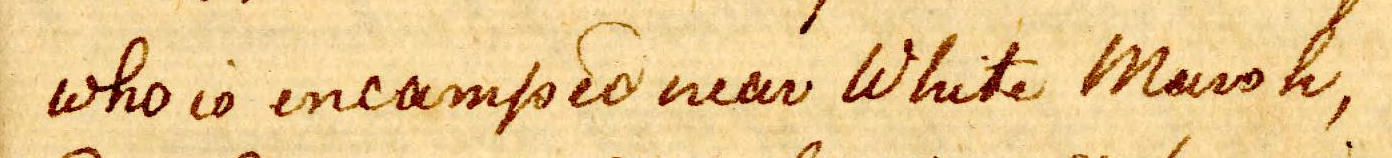who is encamped near White Marsh,
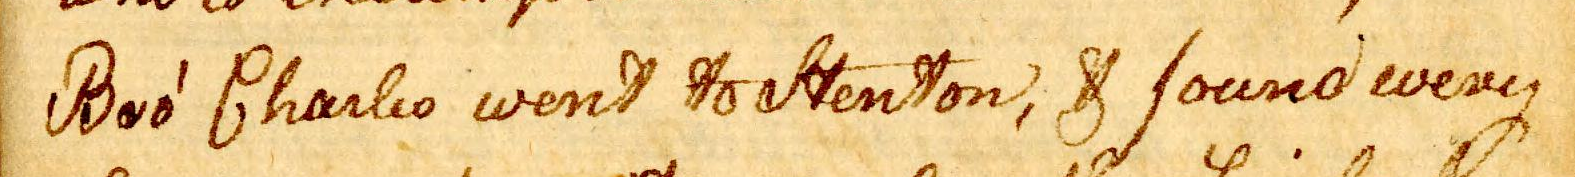Bro' Charles went to Stenton, & found every
